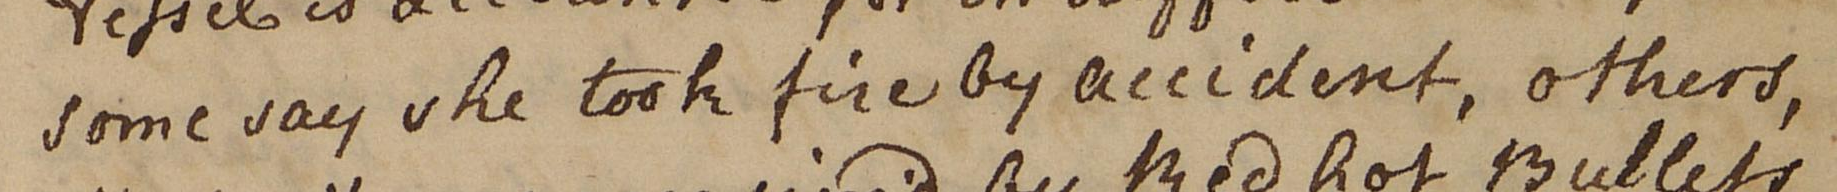some say she took fire by accident, others,
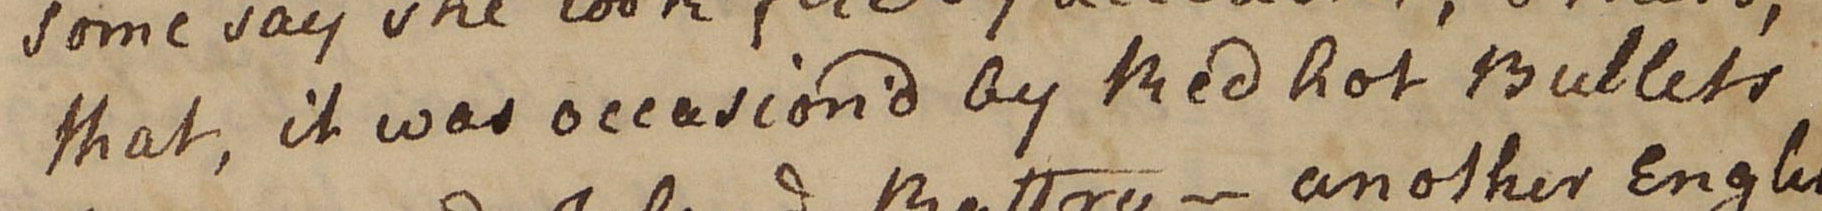that, it was occasion'd by Red hot Bullets
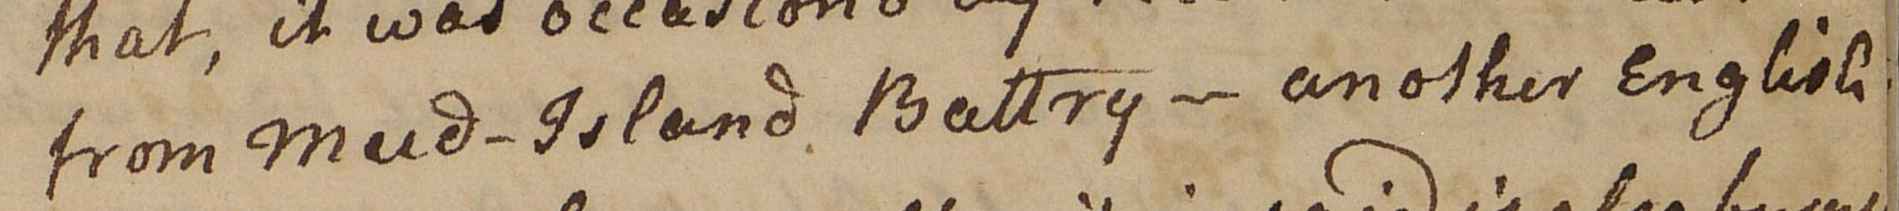from Meed-Island Battry- another English
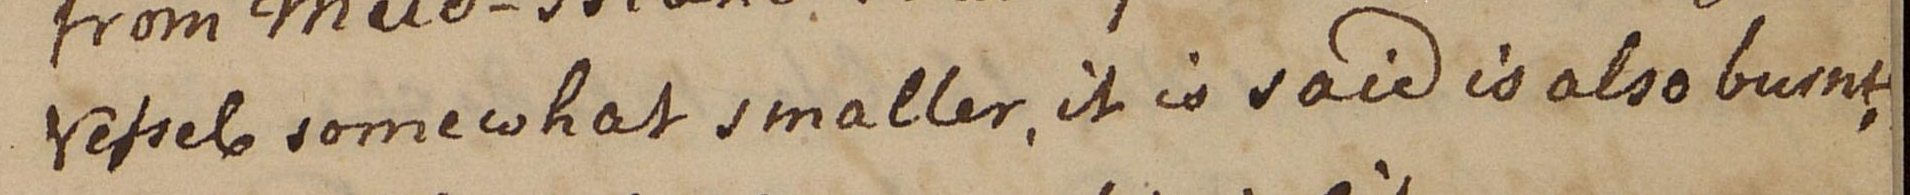Vessel some what smaller, it is said is also burnt,
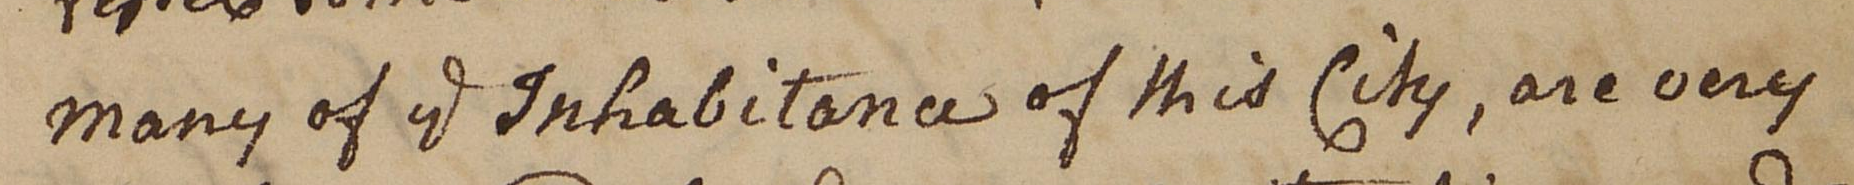many of y^e Inhabitance of this City, are very
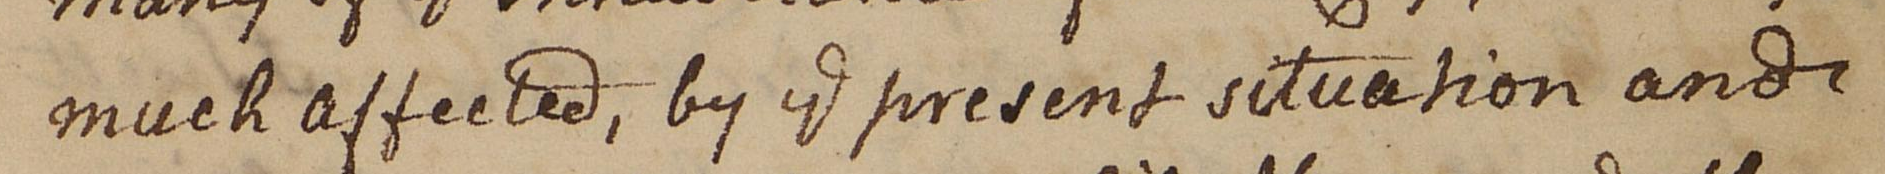much affected, by y^e present situation and
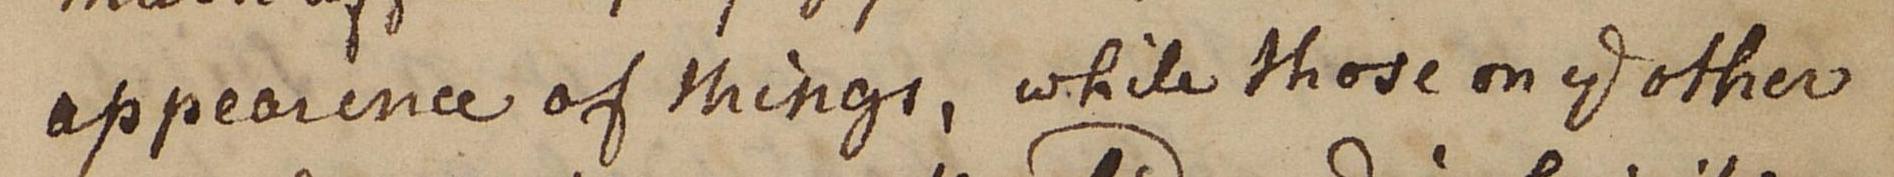appearence of things, while those on y^e other
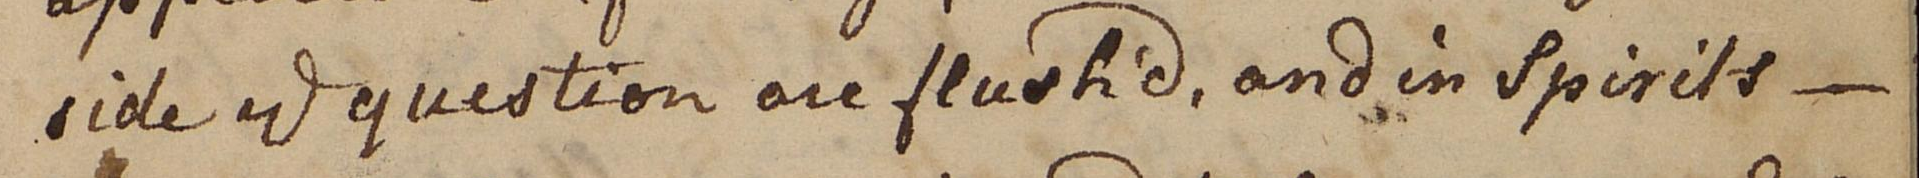side y^e question are flush'd, and in Spirits-
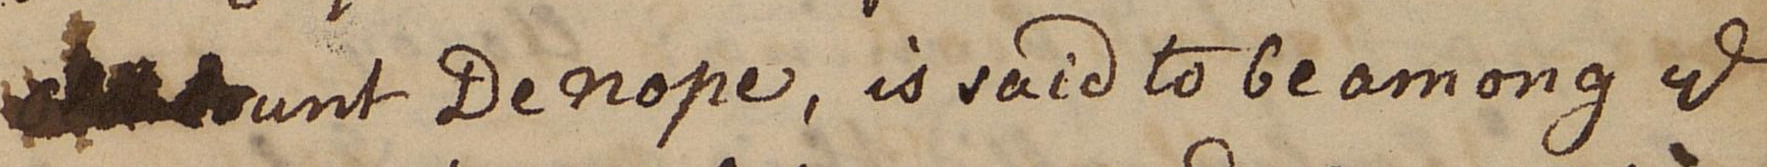[___] Count Denope, is said to be among y^e
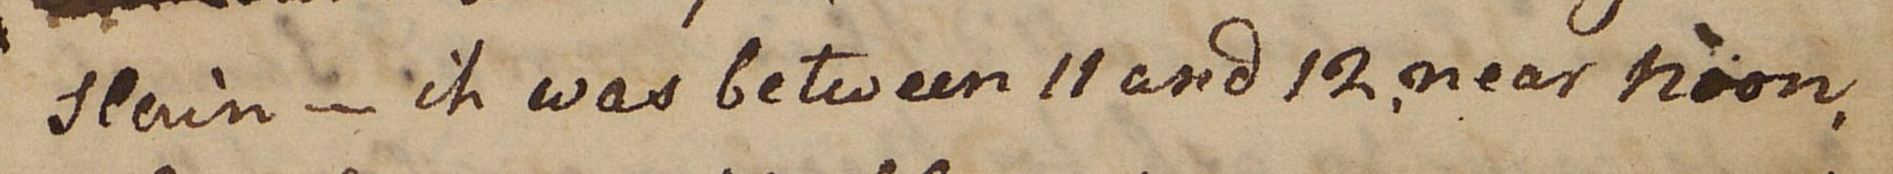slain- it was between 11 and 12, near Noon,
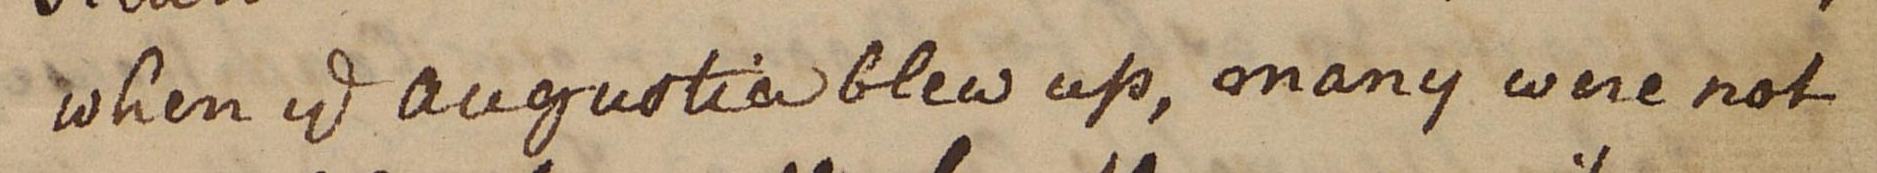when y^e Augustia blew up, many were not
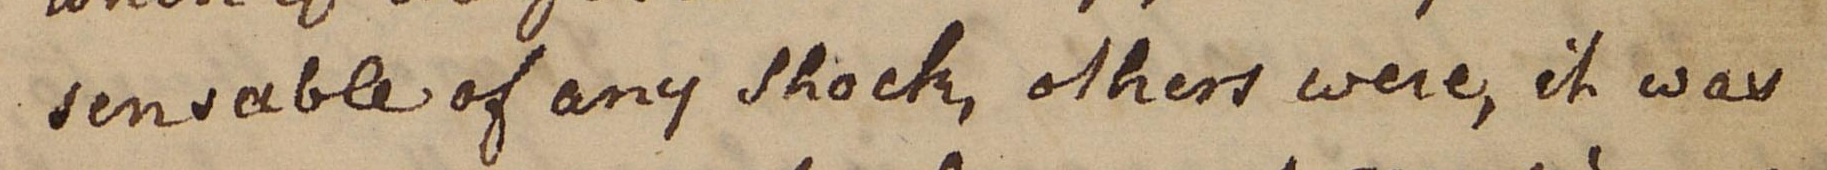sensable of any shock, others were, it was
